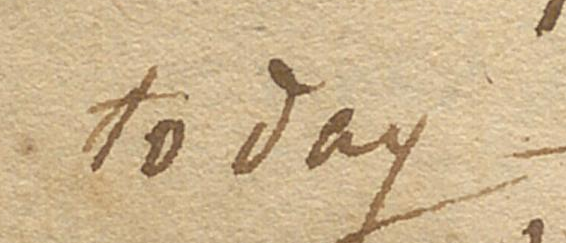to day
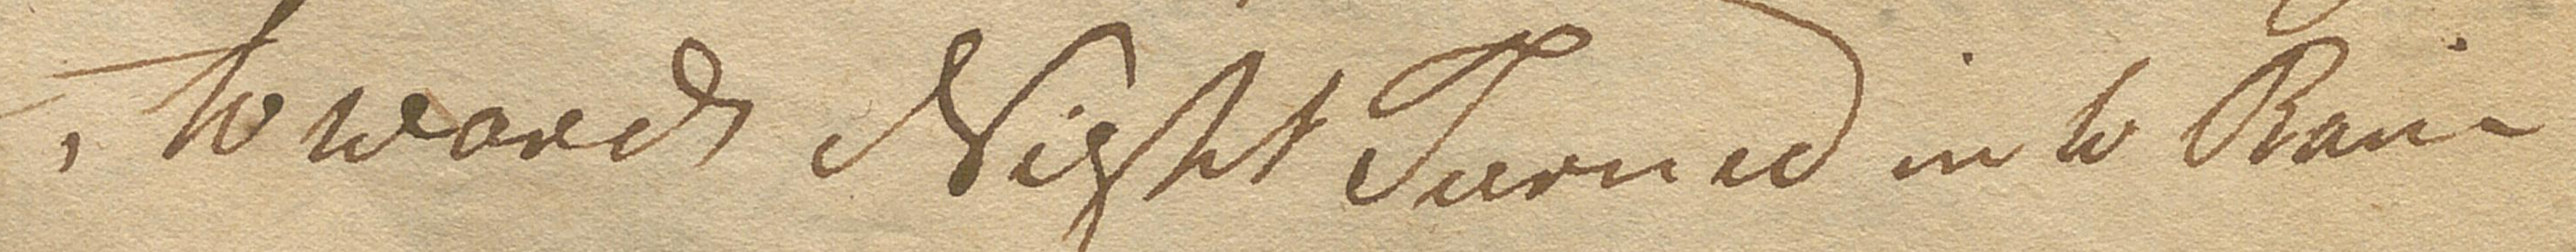towards Night Turned into Rain
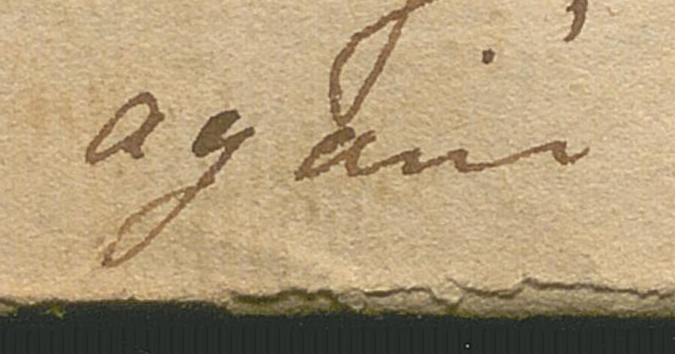again
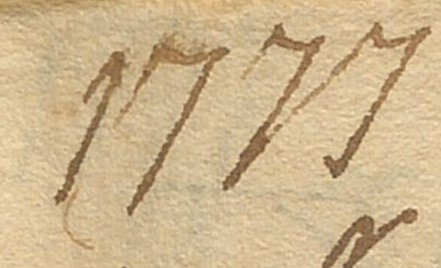1777
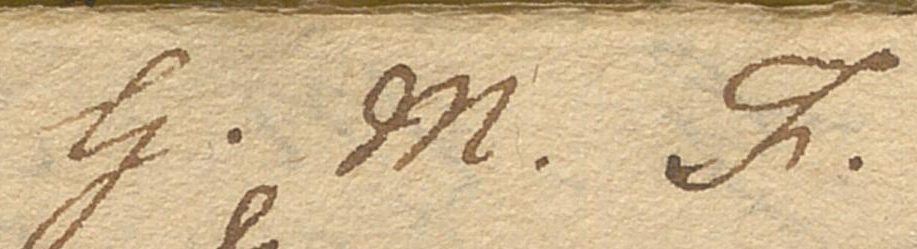G. M. F.
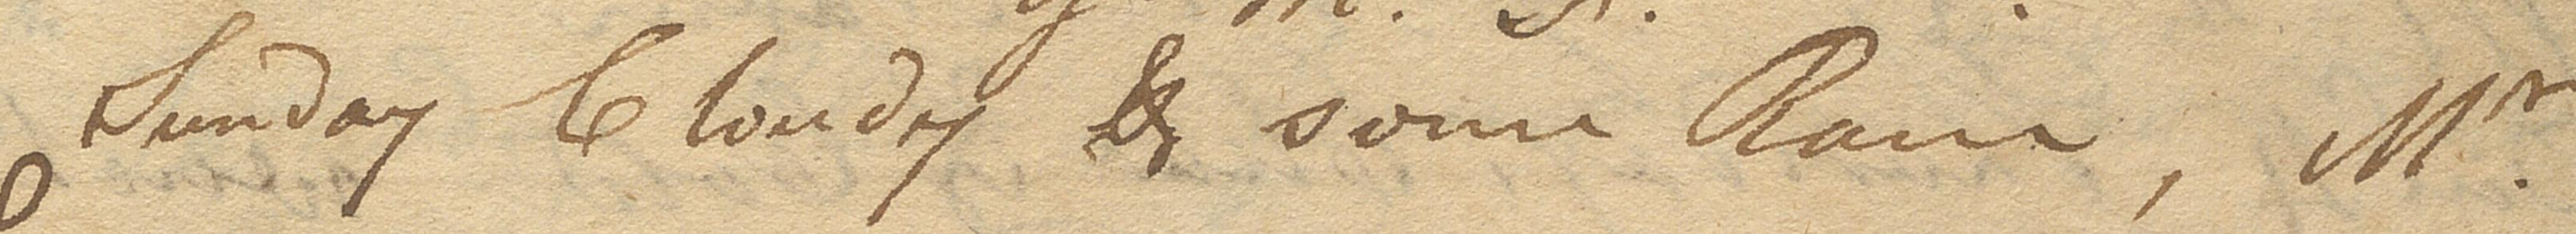Sunday Cloudy & some Rain, M^r.
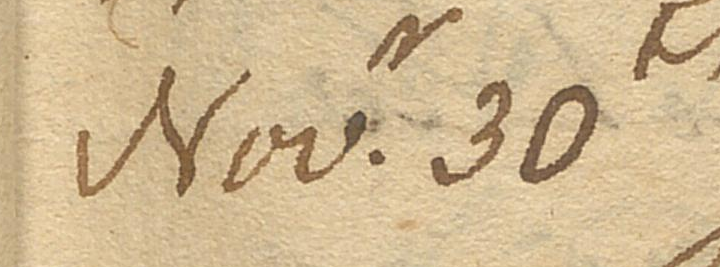Nov^r. 30
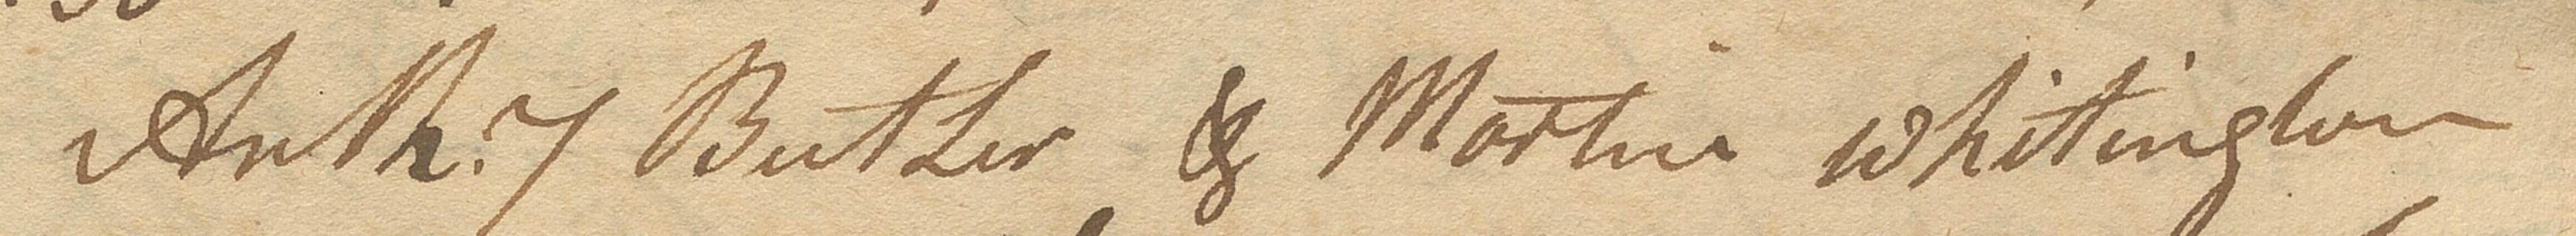Anth^y. Butler & Martin whitington
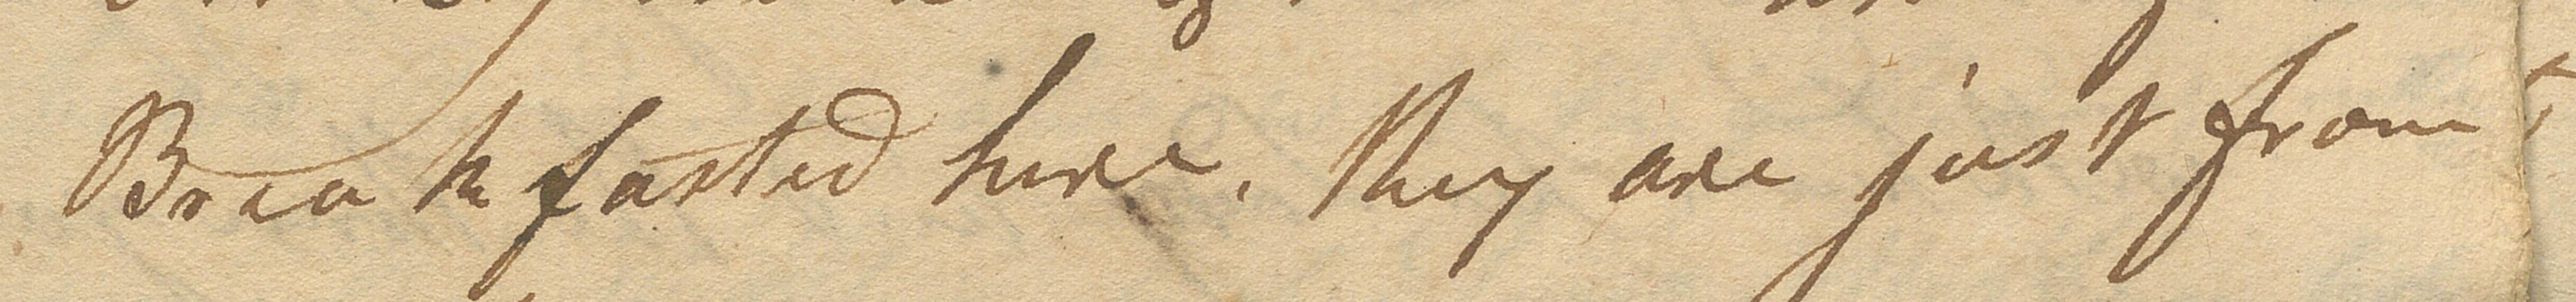Breakfasted here. they are just from
